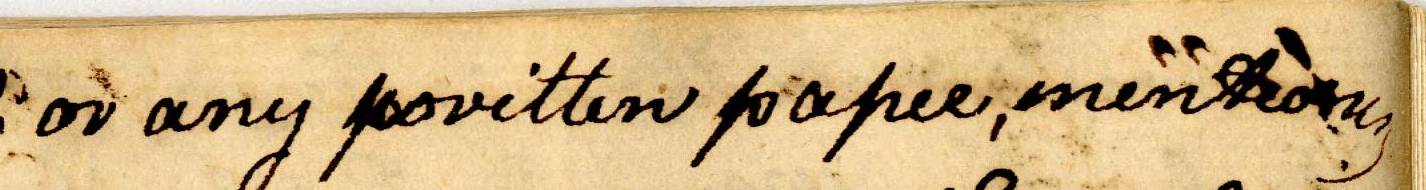or any poritten paper, mentioning
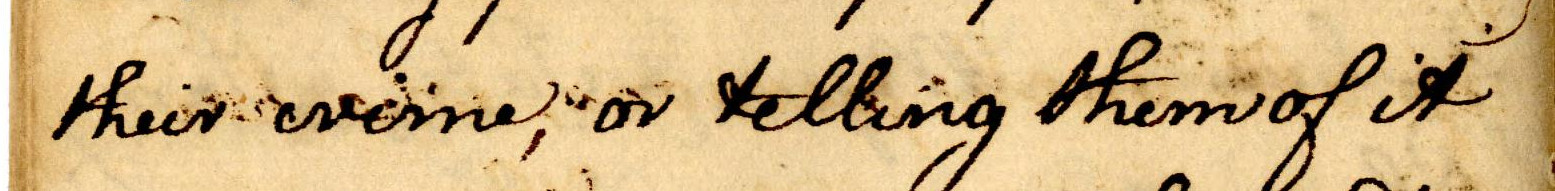their crime, or telling them of it
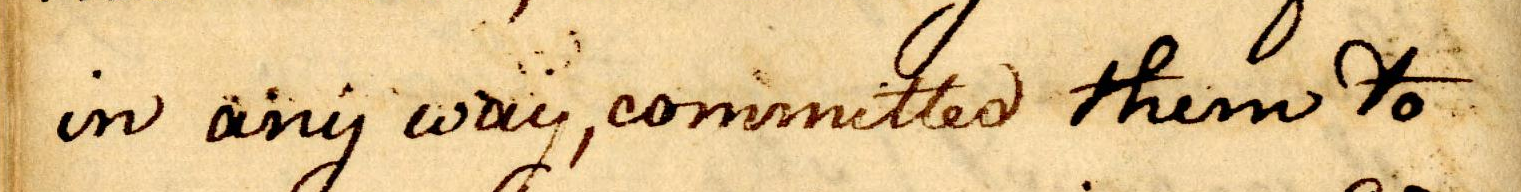in any way, committed them to
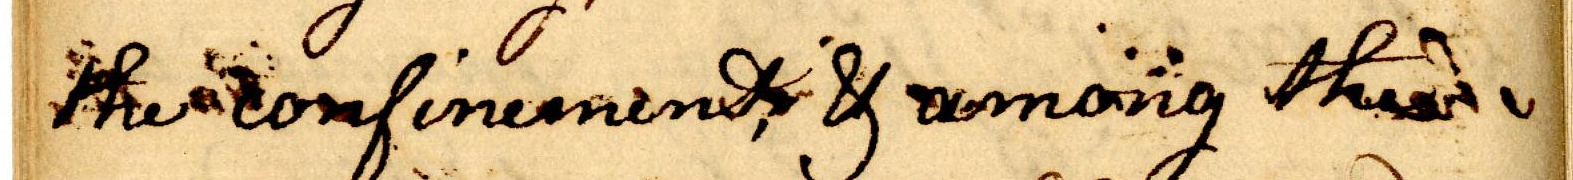the confinement, & among these
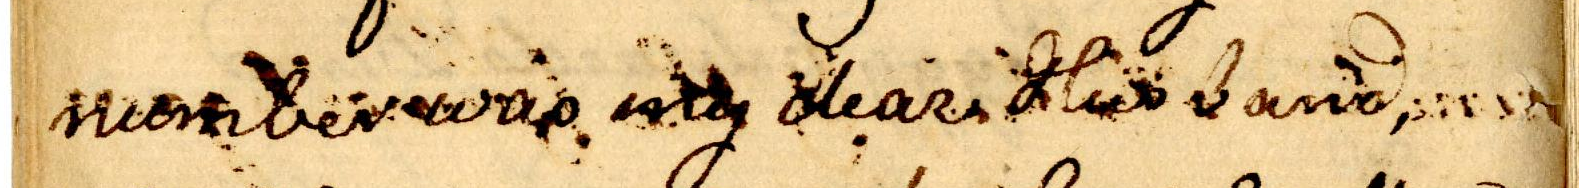number was my dear Husband,
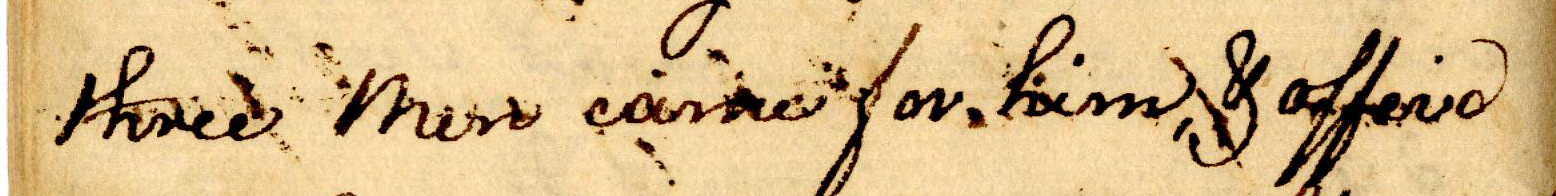three Men came for him, & offer'd
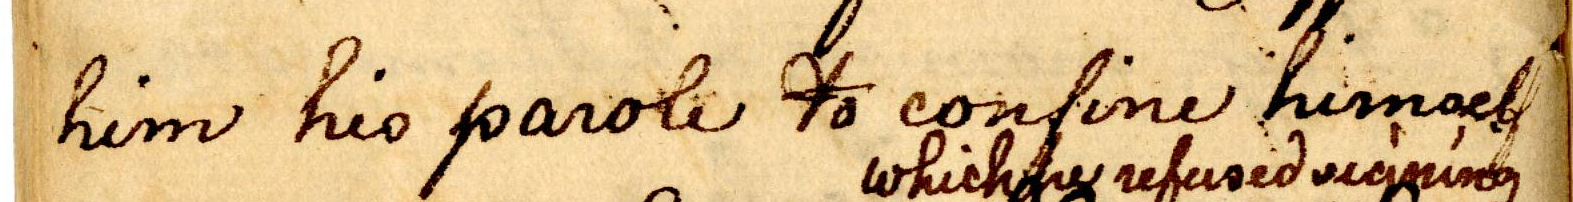him his parole to confine himself
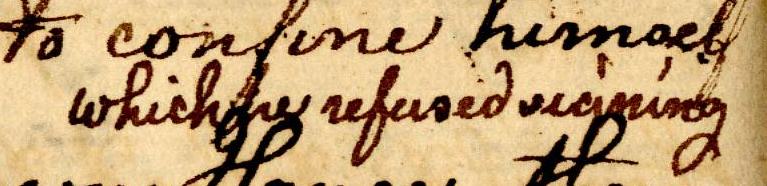which he refused signing
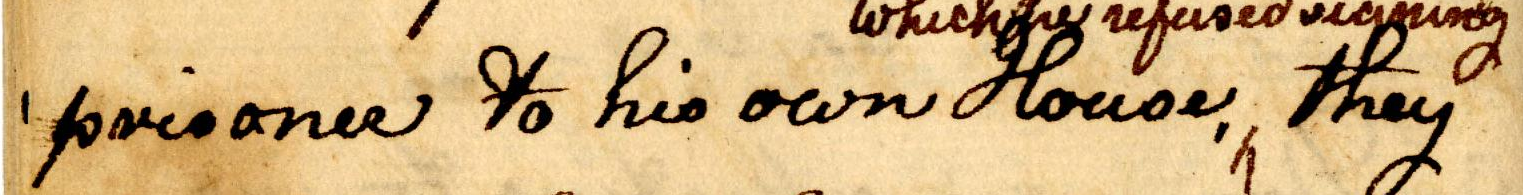prisoner to his own House, ^ they
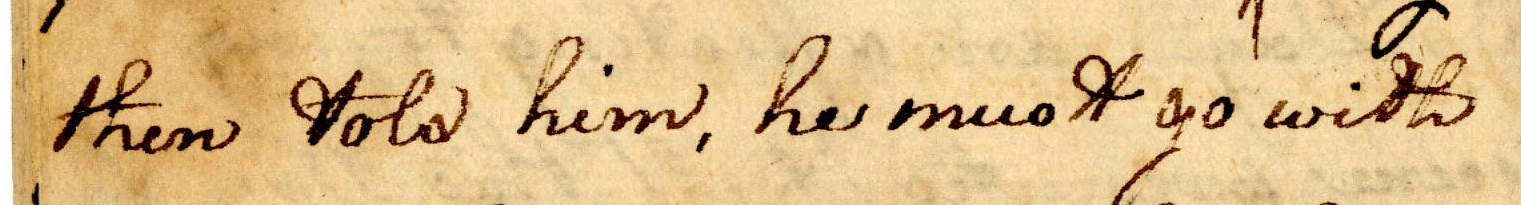then told him, he must go with
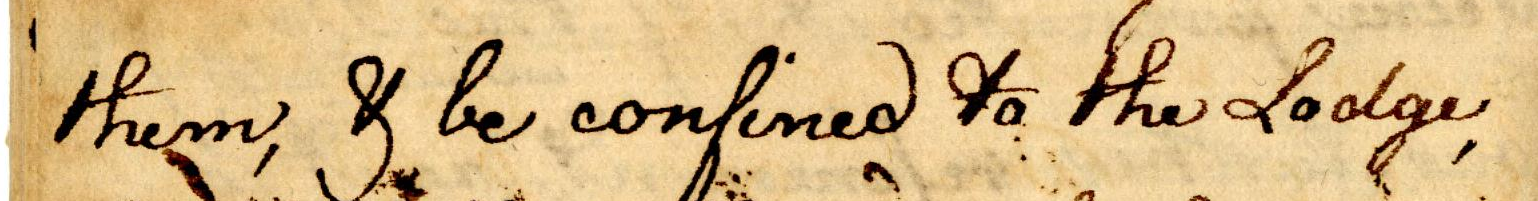them, & be confined to the Lodge,
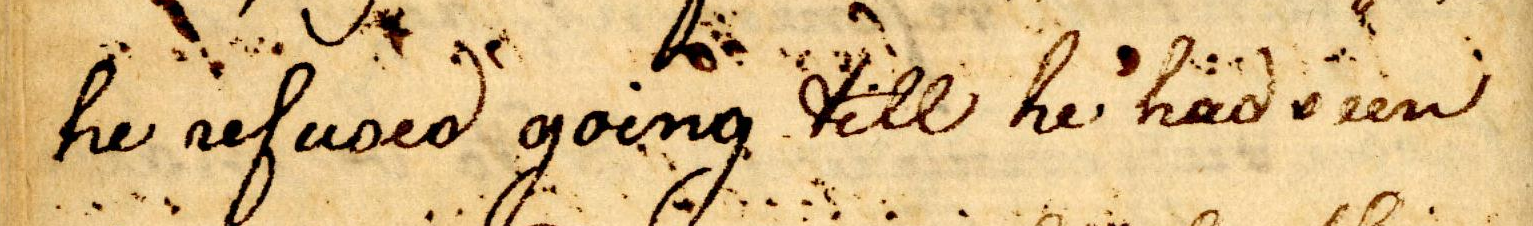he refused going till he had seen
